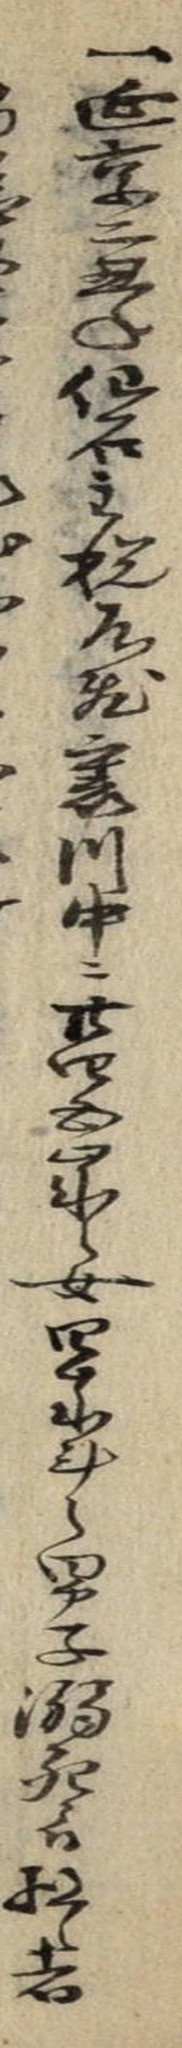一延享二丑年仙石主税屋敷裏川中に廿四五歳之女四歳斗之男子溺死に付組之者
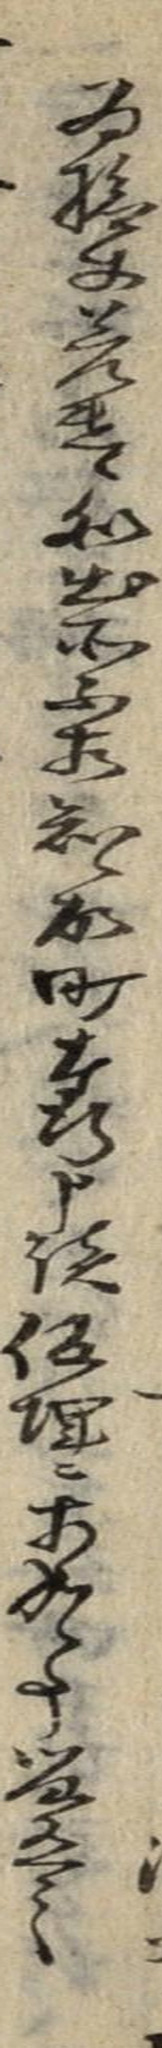為検使差遣候処出所不相知候故町奉行申談仮埋に相成候事留有之
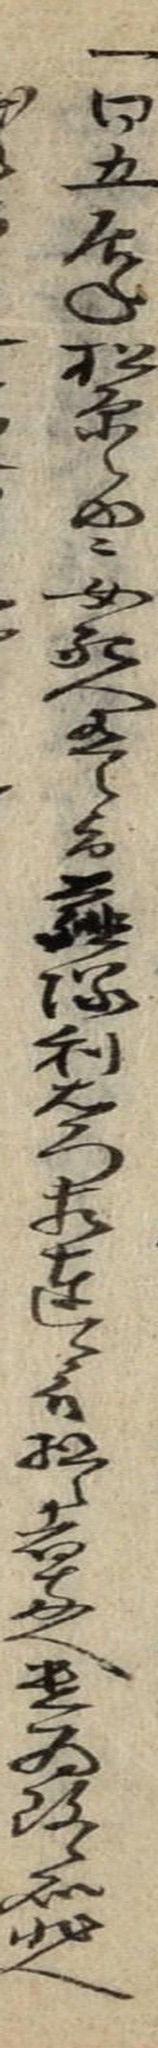一同五辰年松原之内に女死人有之旨薤塚利右衛門相達候に付組之者両人遣為改候処非人
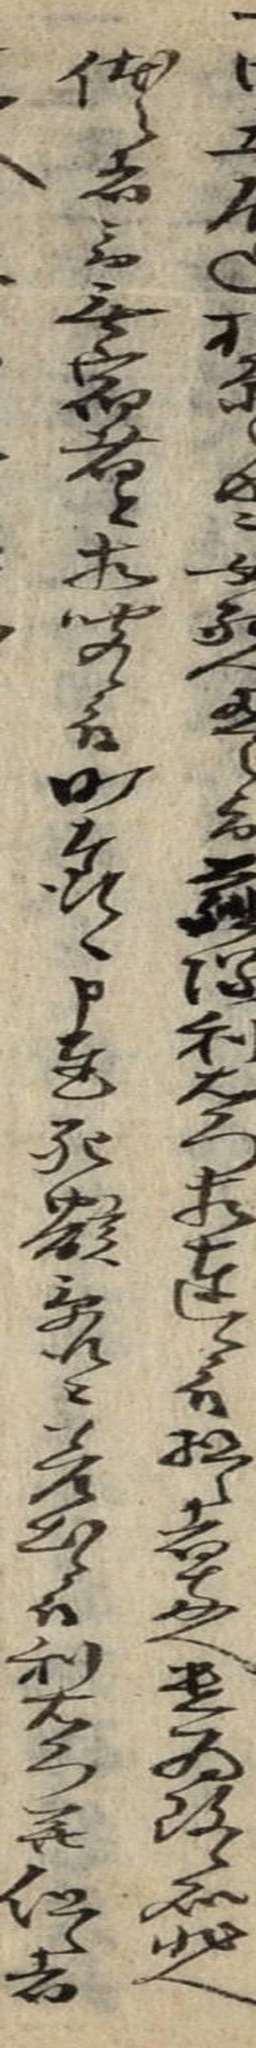体之者にて無宿者と相聞候に付町奉行へ申達死骸受取に差出候に付利右衛門并組之者
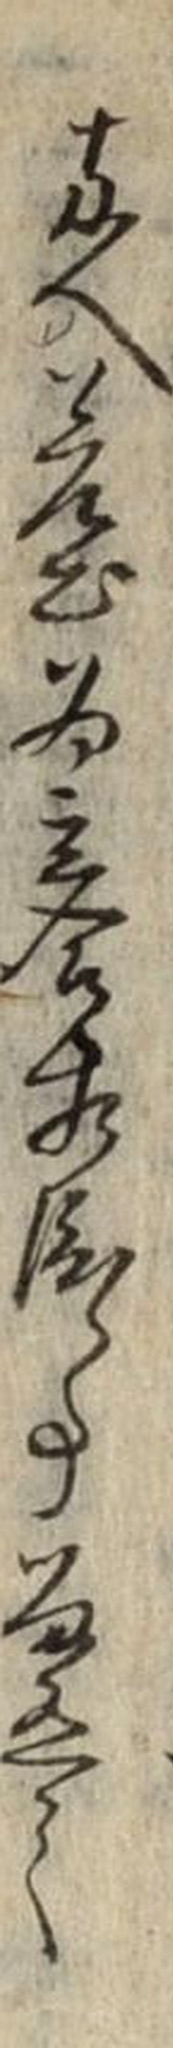両人差出為立合相渡候事留有之
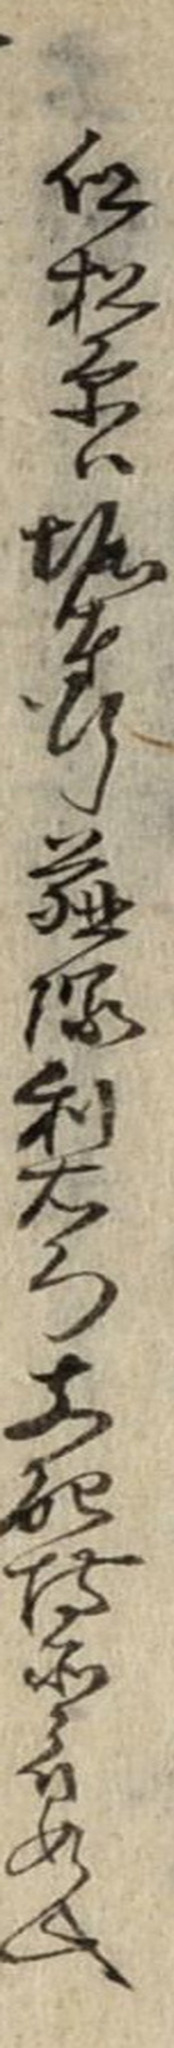但松原は堀奉行薤塚利右衛門支配場所に付如此
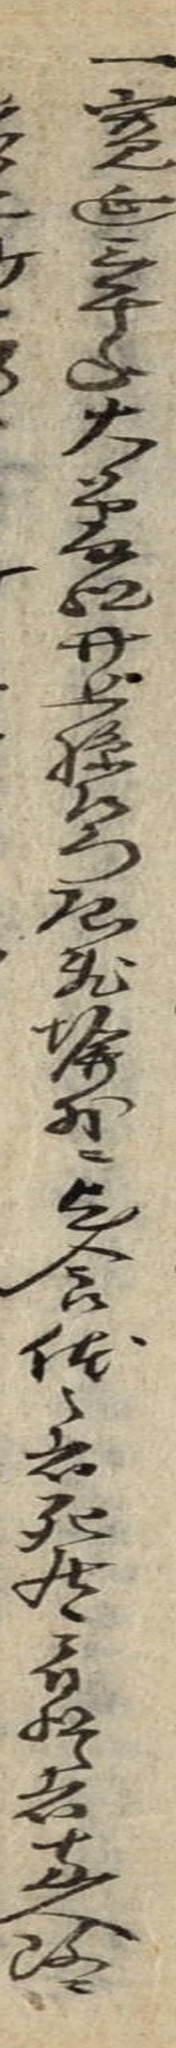一寛延三午年大御番組井上孫左衛門屋敷塀外に乞食体之者死居候に付組之者両人改に
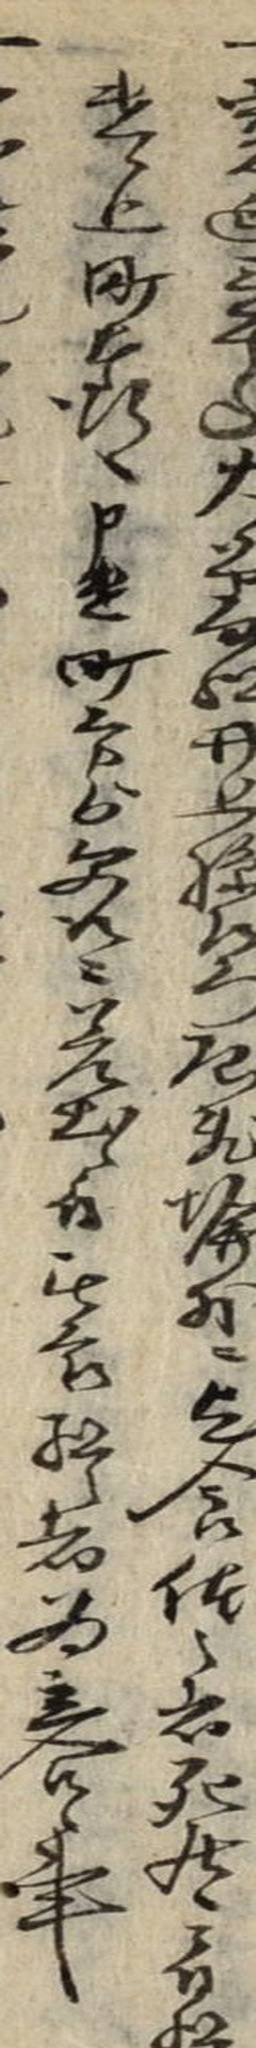遣候上町奉行へ申遣町方ゟ受取に差出候に付其節組之者為立合候事
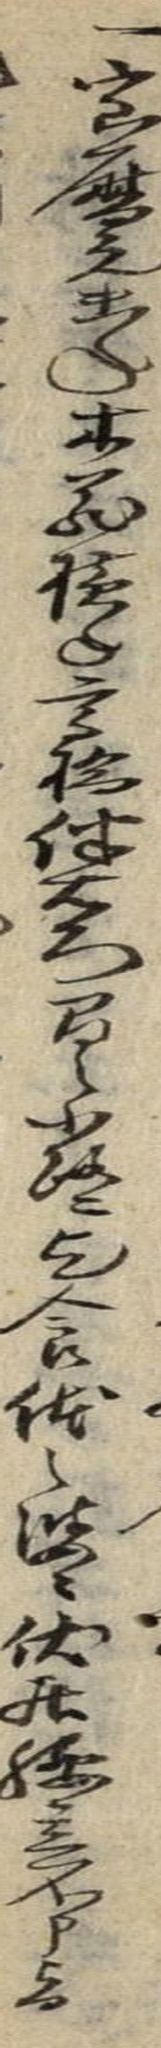一宝暦元未年木蔵横手高橋伴右衛門間之小路に乞食体之婆々伏居腰立不申旨
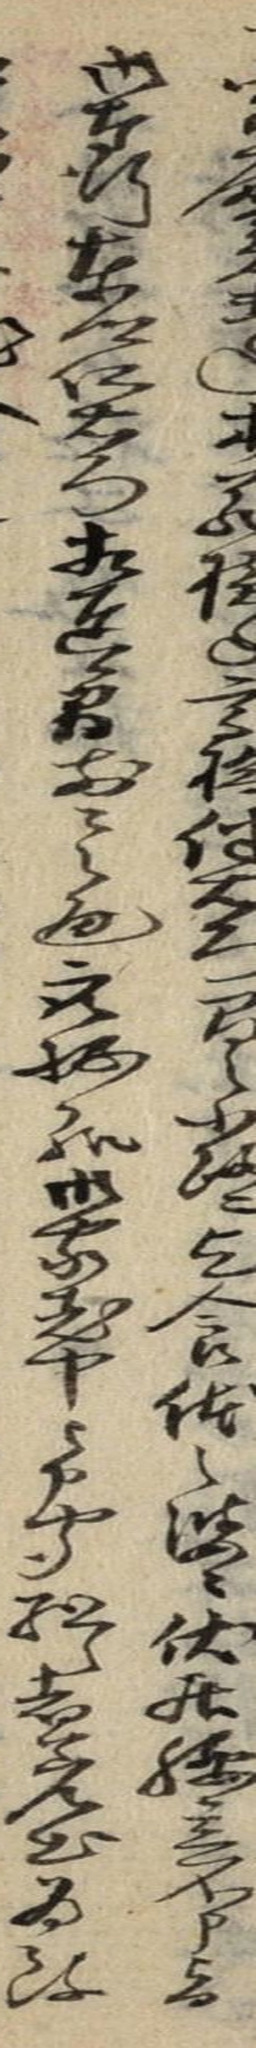御奉行東郷仁右衛門相達候間前々之通取扱候様御家老中被申聞組之者差出為致
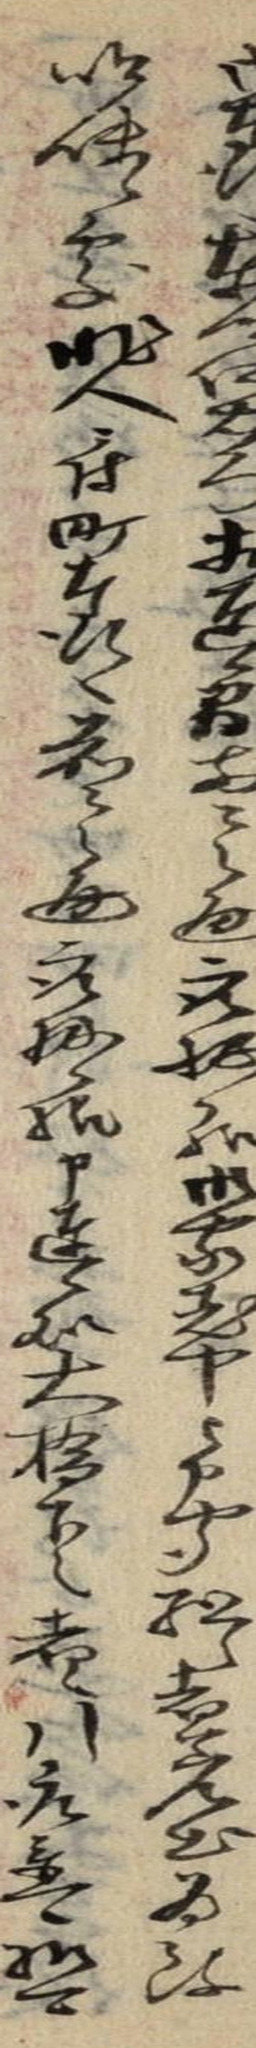吟味候処非人に付町奉行へ前々之通取扱候様申達候処大橋下之者へ引取置候様可
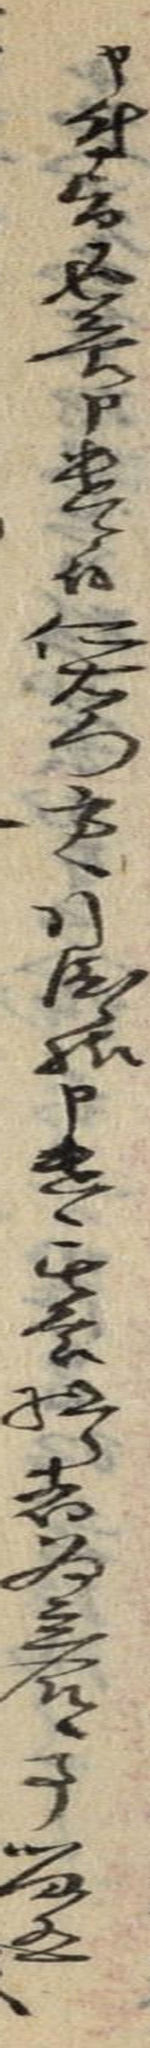申付旨返答申遣候に付仁右衛門方へ引渡候様申遣候其節組之者為立合候事留有之
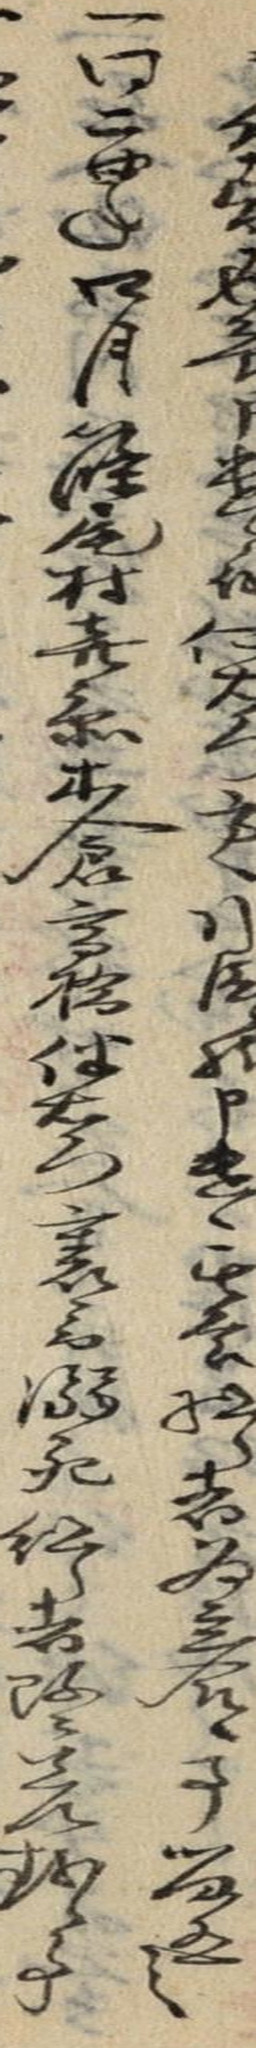一同二申年四月篠尾村喜兵衛木倉高橋伴右衛門裏にて溺死組之者改に差越候事
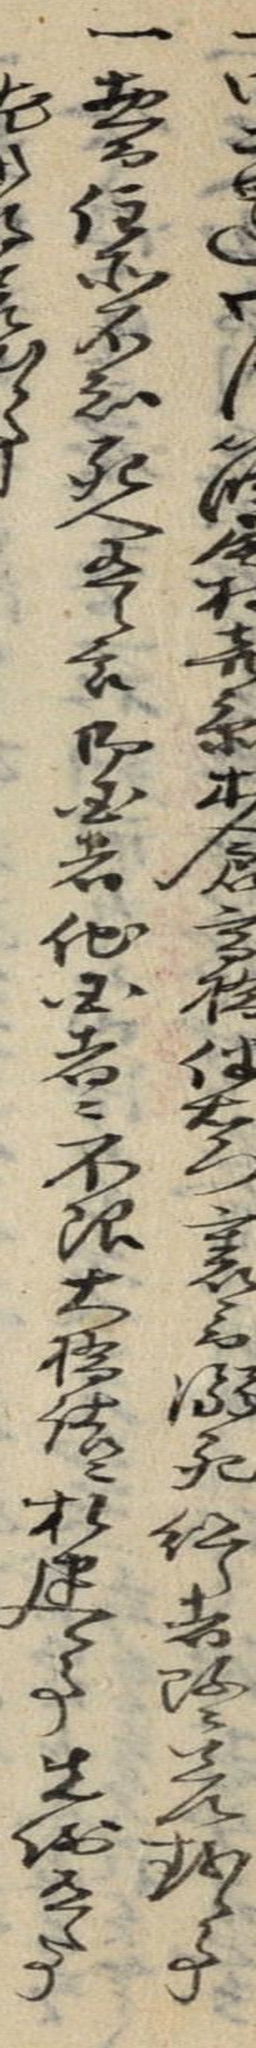一惣て住所不知死人有之節御国者他国者に不限大橋詰に札建候事先例有之事
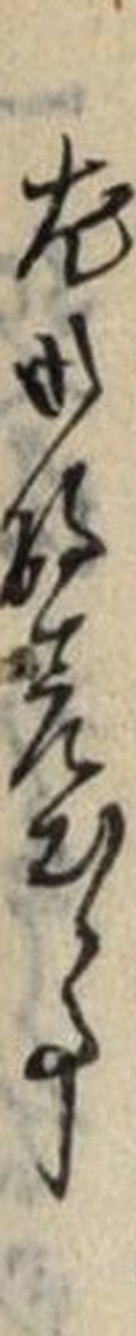尤御触差出候事
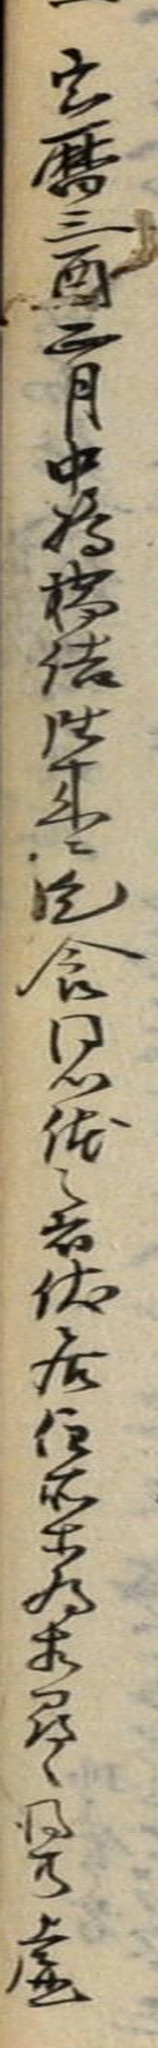一宝暦三酉正月中島橋詰往来に乞食同心体之者伏居住所等為相尋候得共虚
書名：御停止異変死失
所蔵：福井県文書館 Fukui Prefectural Archives
